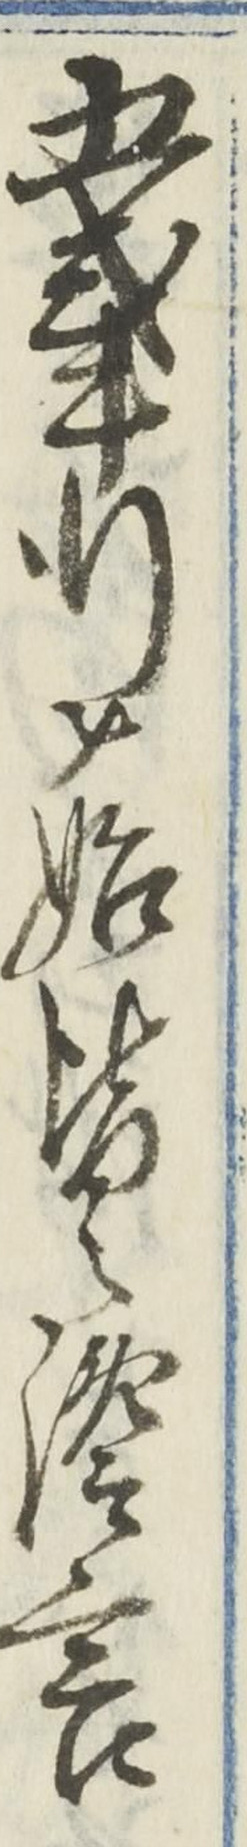五奉行ヲ始皆々讒言
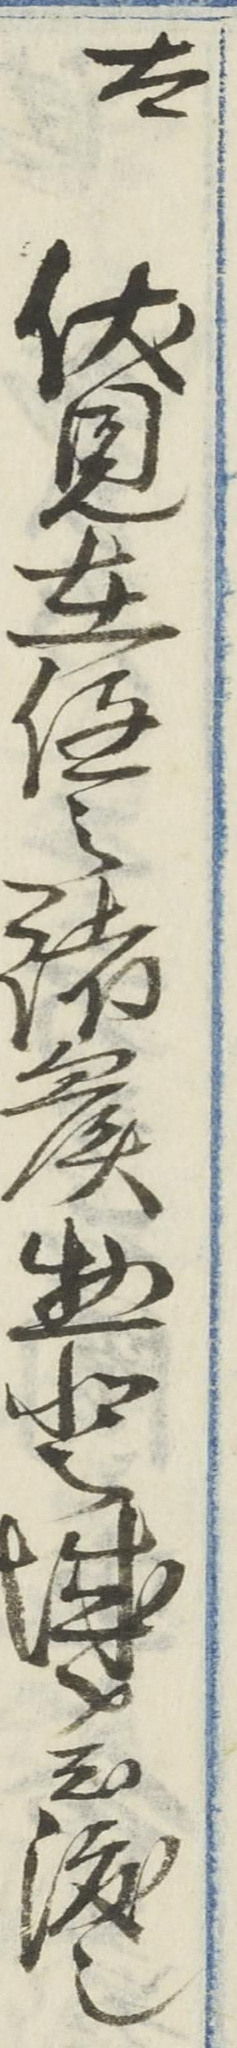太伏見在住之諸侯惣登城ヲ云渡し
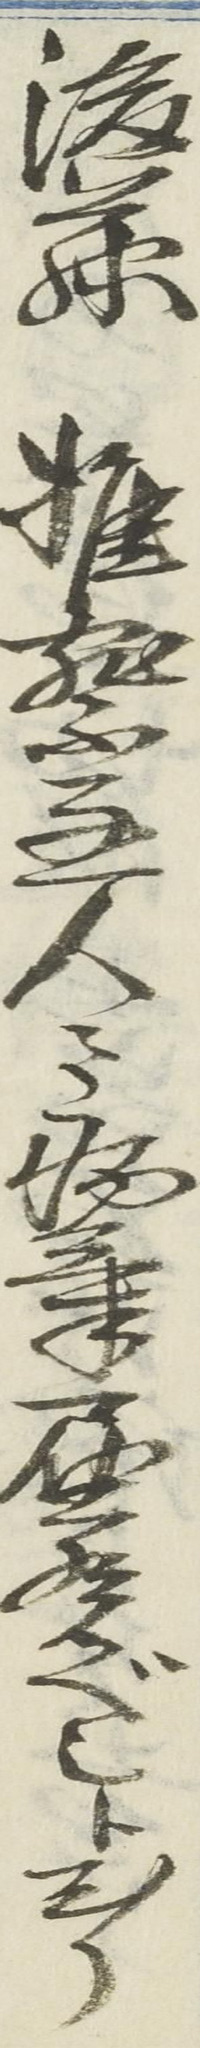後藤推察主人ニ病気届有ルベシト云う
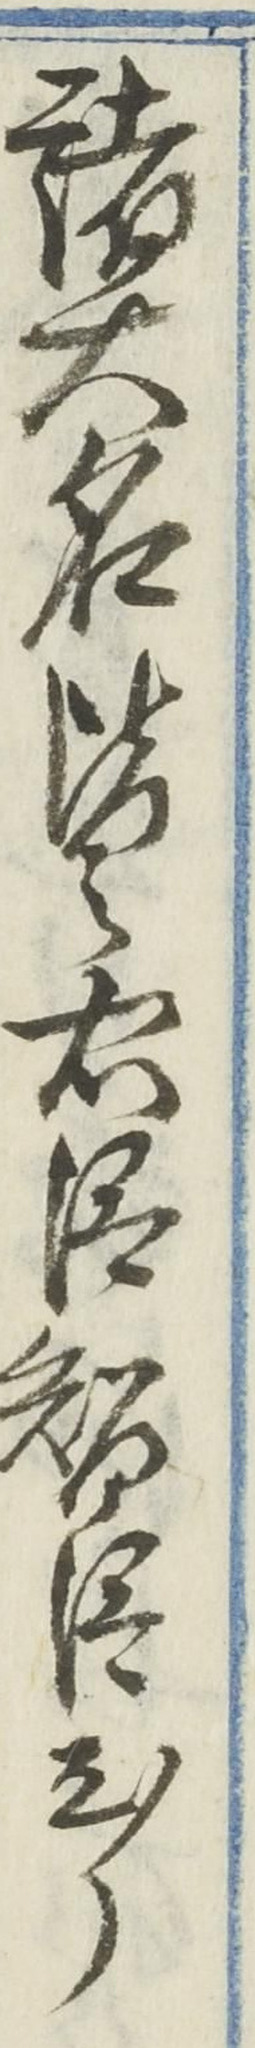諸大名皆々忠臣智臣云う
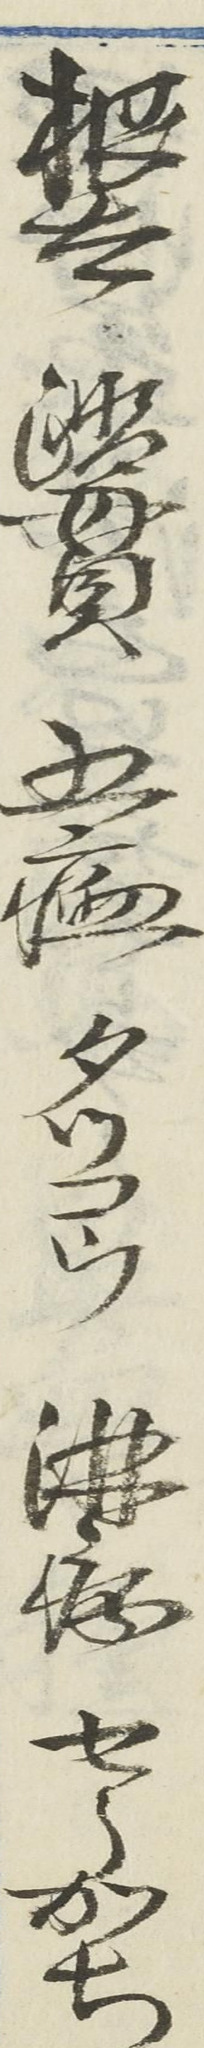根太踏貫五タツコウ淋病せうかち
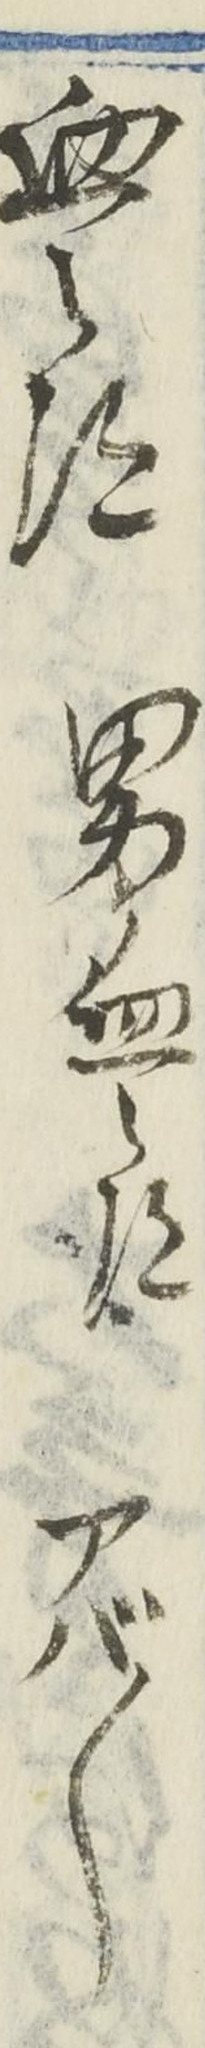血之道男血之道アバ〳〵
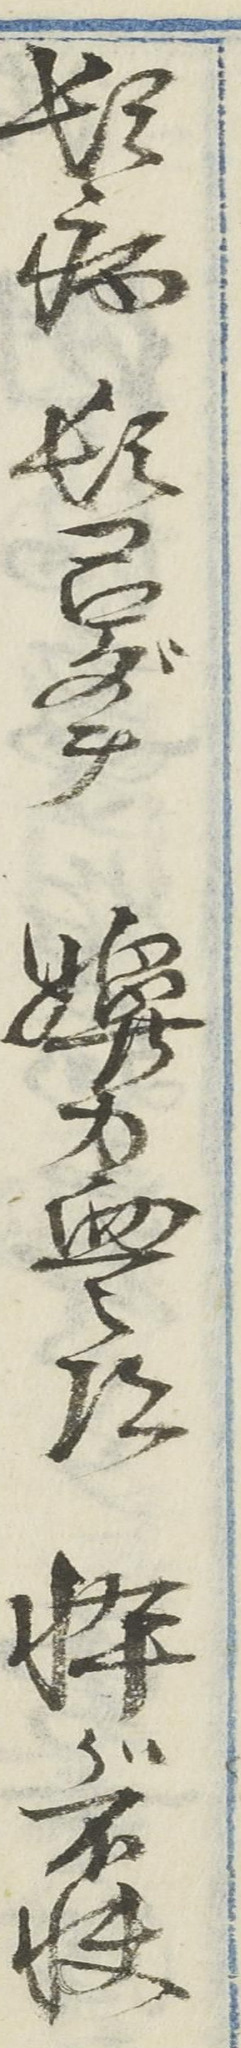頓病頓コロダチ嬶カ血之道忰が不快
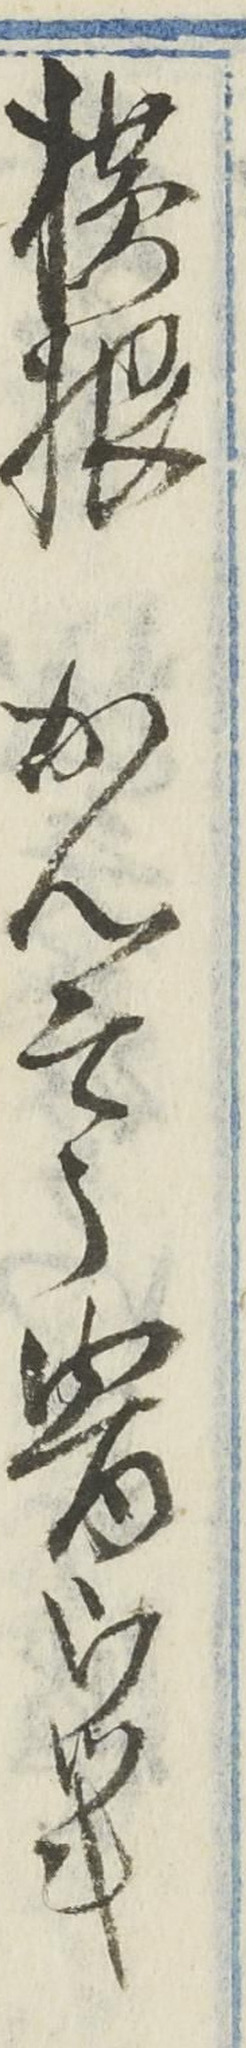横根かんそう胃ウツキ
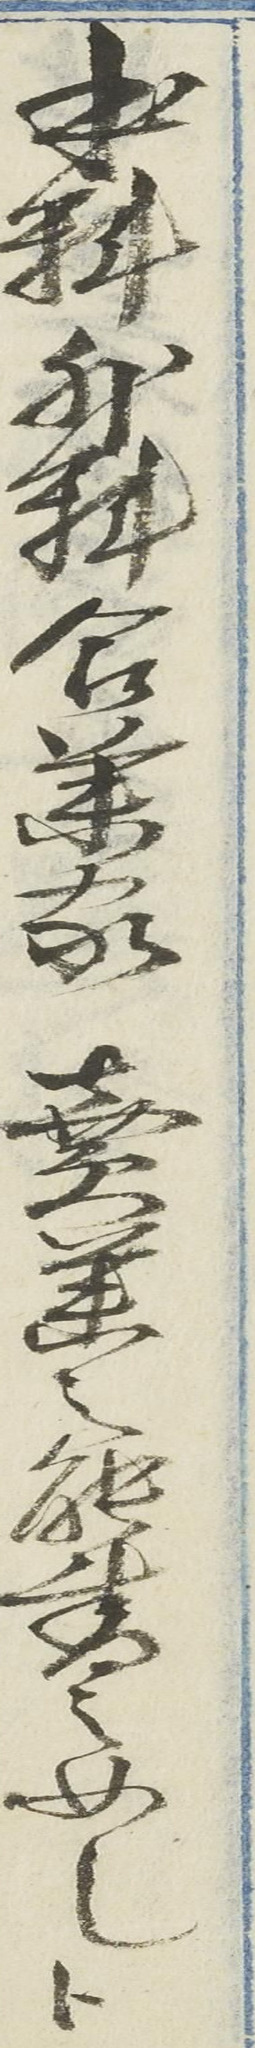本科外科合薬家売薬之能書之如しト
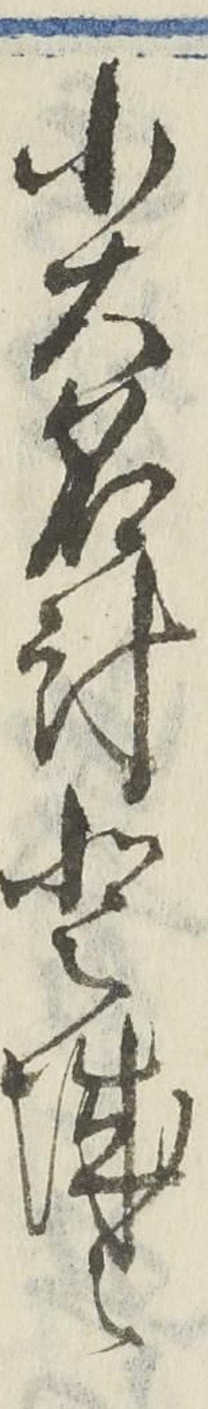小大名計登城シ
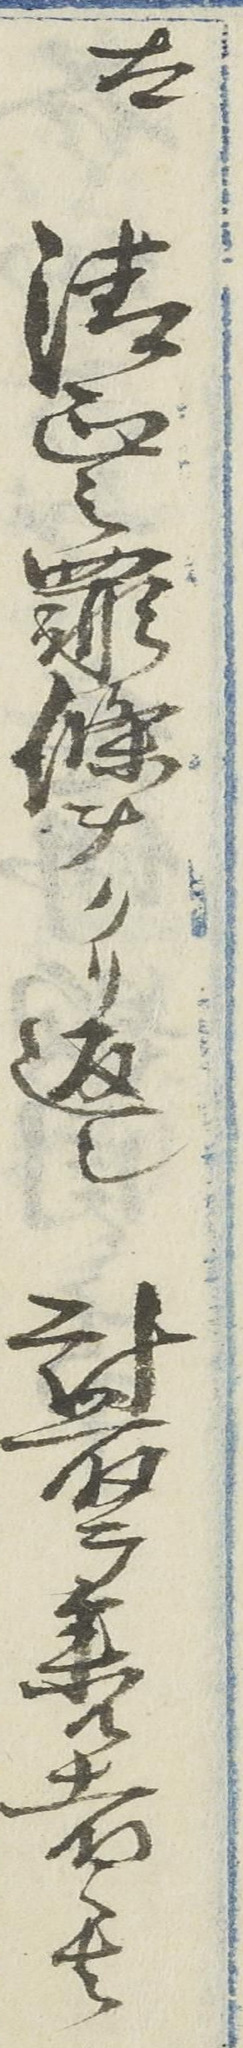太清正之罪條ヲクリ返し討取テ参ル者は
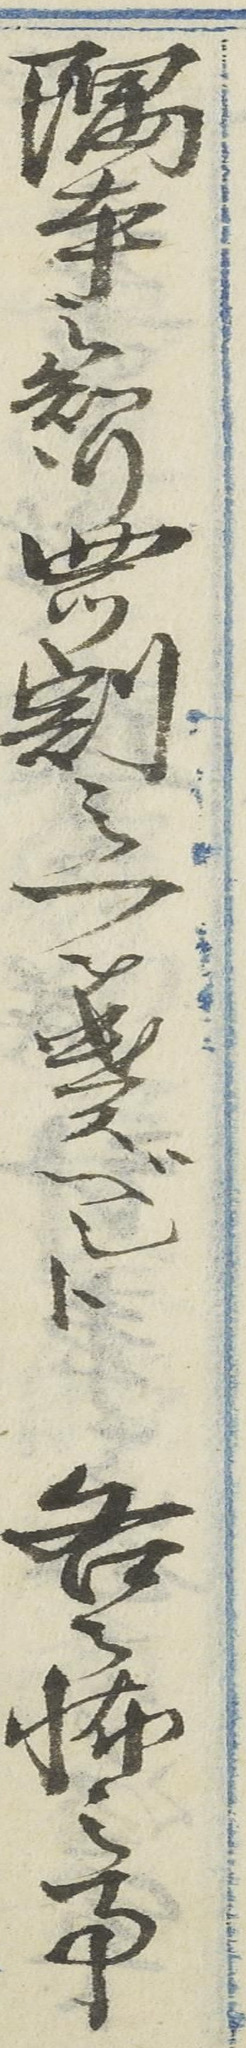隅本之知行四ツ割之一ヲ遣スベシト各々怖之事

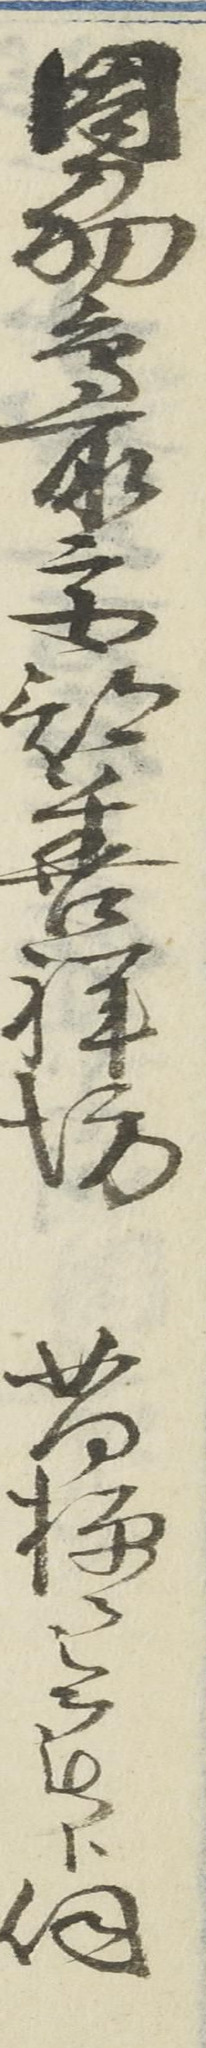因州鳥取宮部善祥坊如何様ニシテモト伺
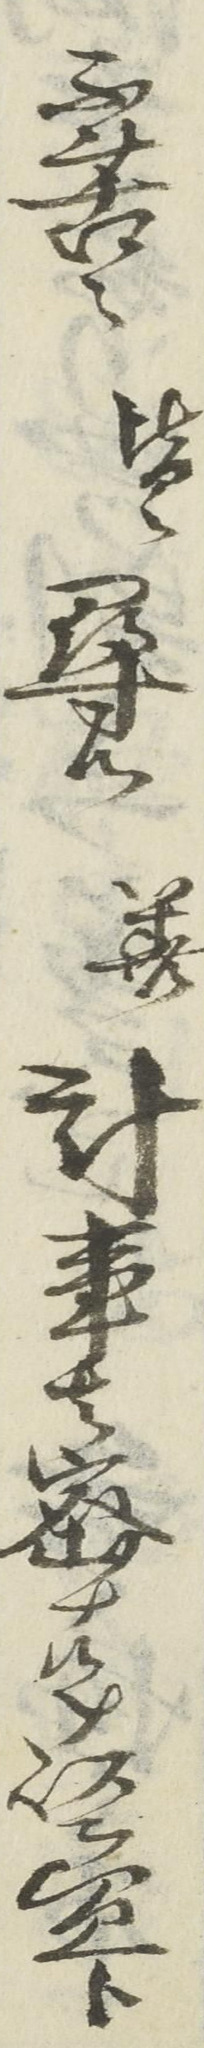太不苦之皆々尋ル善計事は密ナルヲ以テ宜ト
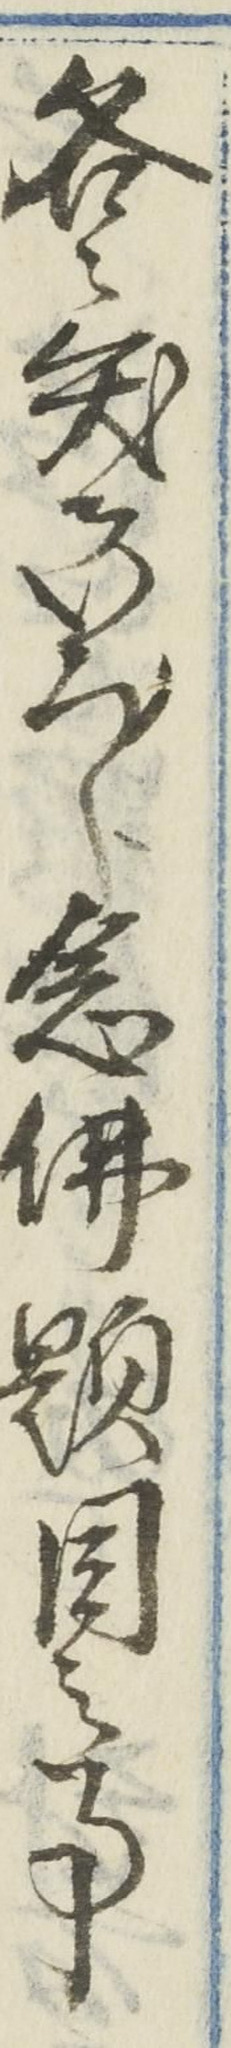各々知テいろ〳〵念佛題目之事
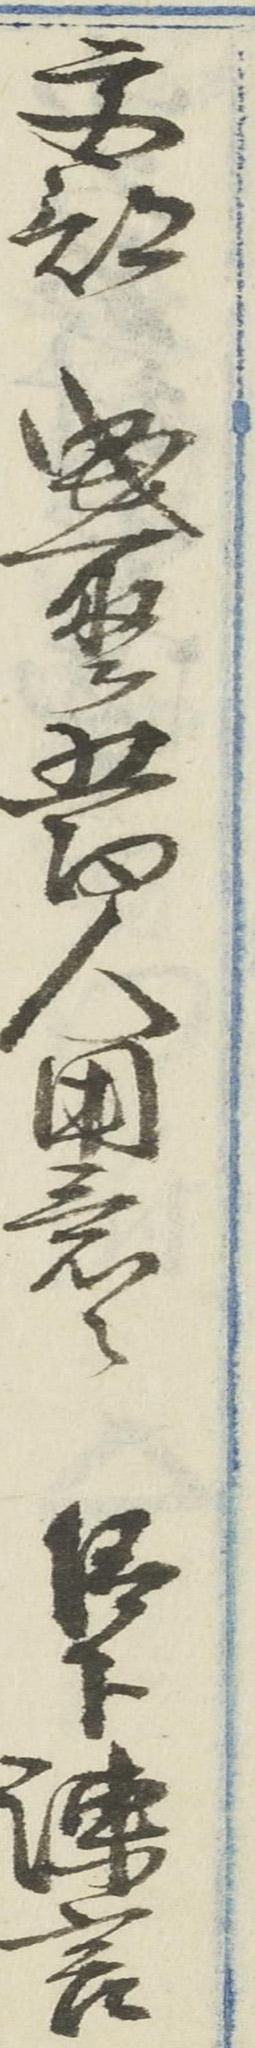宮部曳取テ五百人用意之臣下諌言
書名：伏水大地震
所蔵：東京大学地震研究所図書室 Earthquake Research Institute Library, The University of Tokyo, JAPAN
